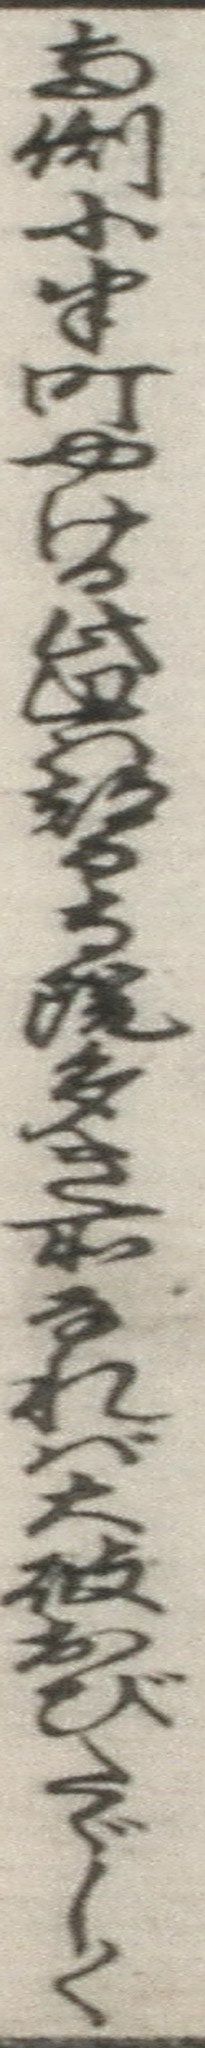両側に半町やける此辺は都而寺院多き所なれバ大破おびたゞしく
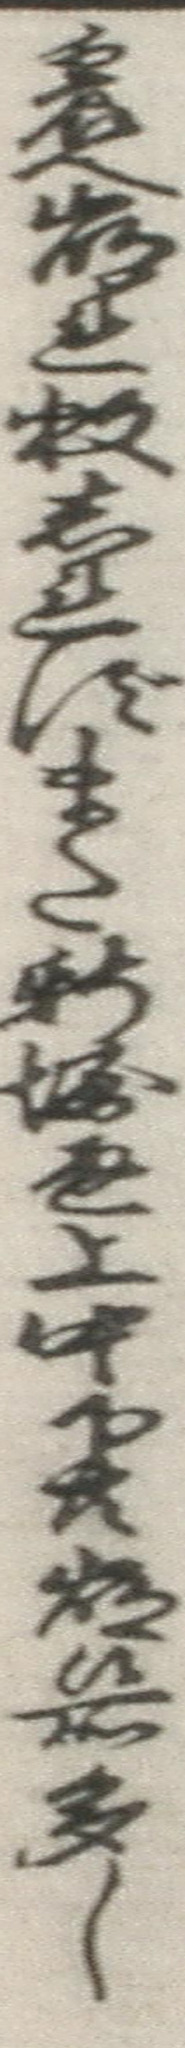裏へ崩れ数しれずまた新堀通上中下共崩候所多し
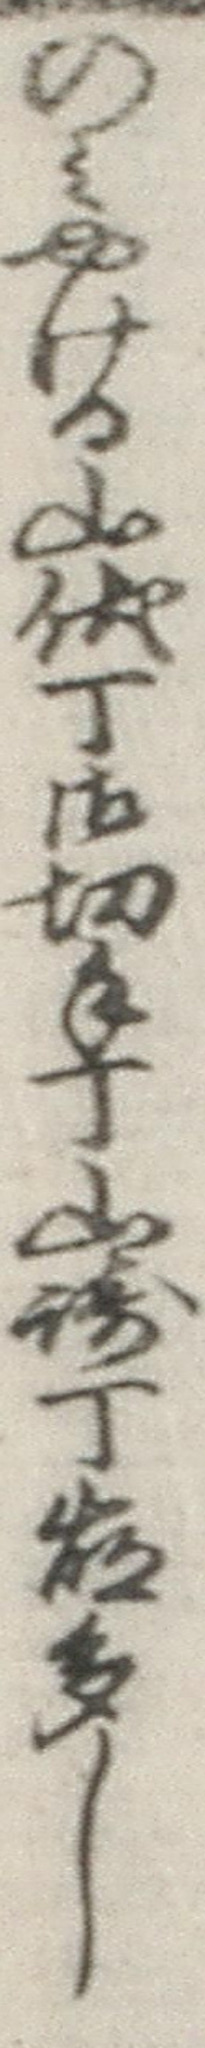のミやける山伏丁御切手丁山﨑丁崩多し
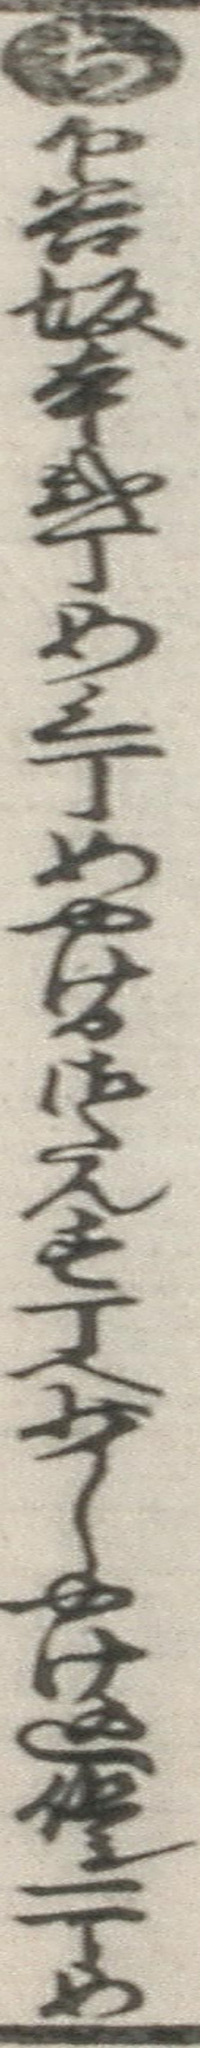ち下谷坂本弐丁め三丁めやける御たんす丁へ少しやけ込但シ一丁め
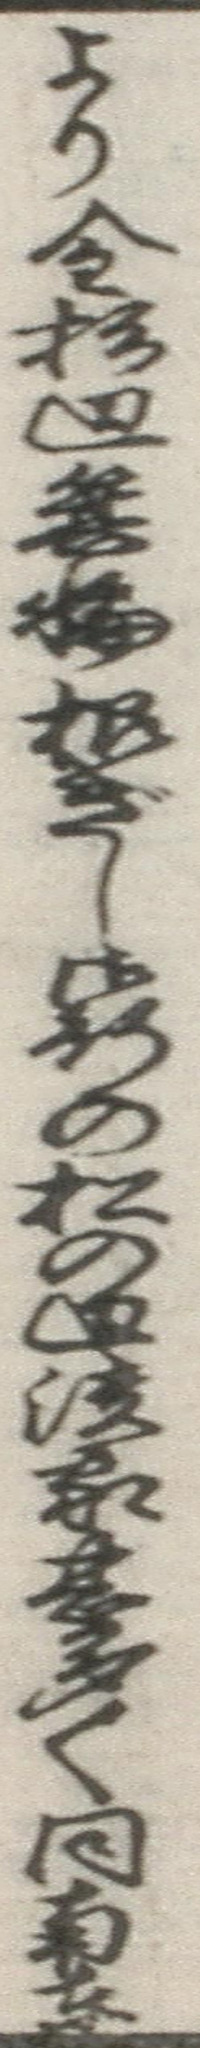より金杉辺箕輪根ぎし御行の松の辺潰家甚多く同南東
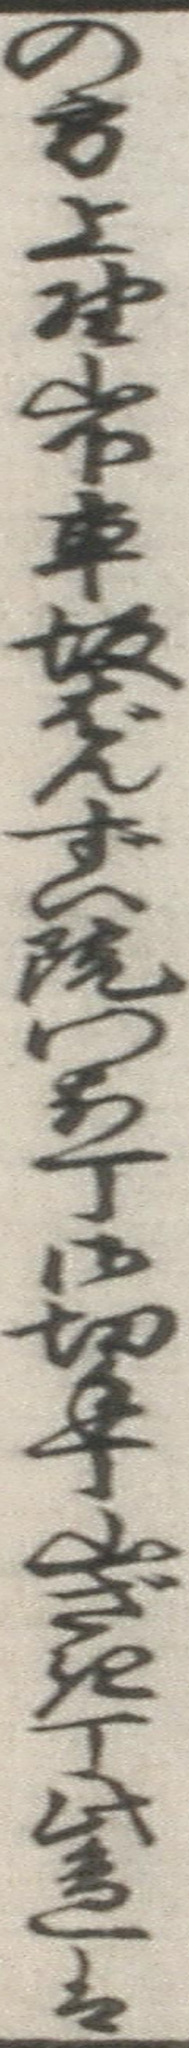の方上野山下車坂ばんずい院門前丁御切手丁山ざき丁此辺は
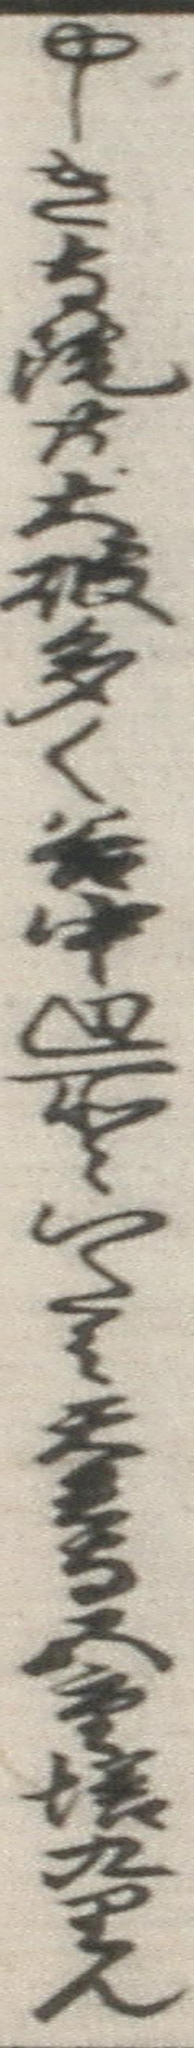やしき寺院共大破多く谷中辺所々いたミ天王寺五重塔九りん
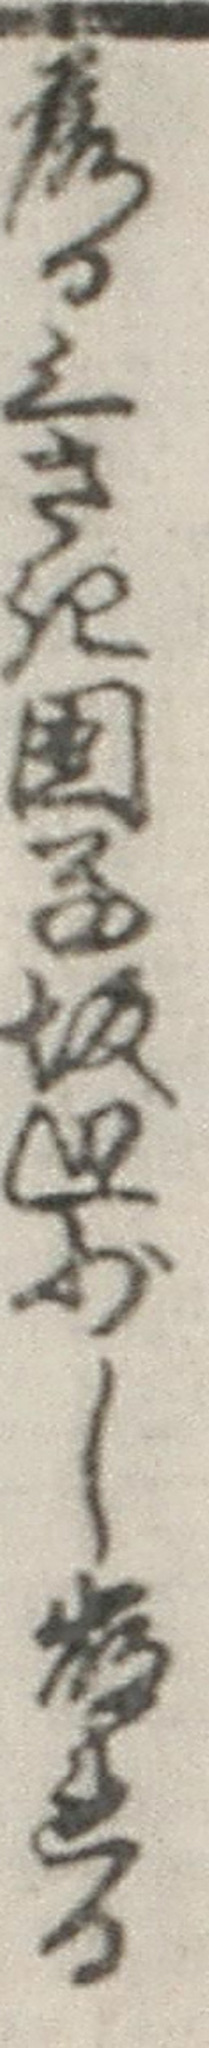落るみさき団子坂辺少し崩れる
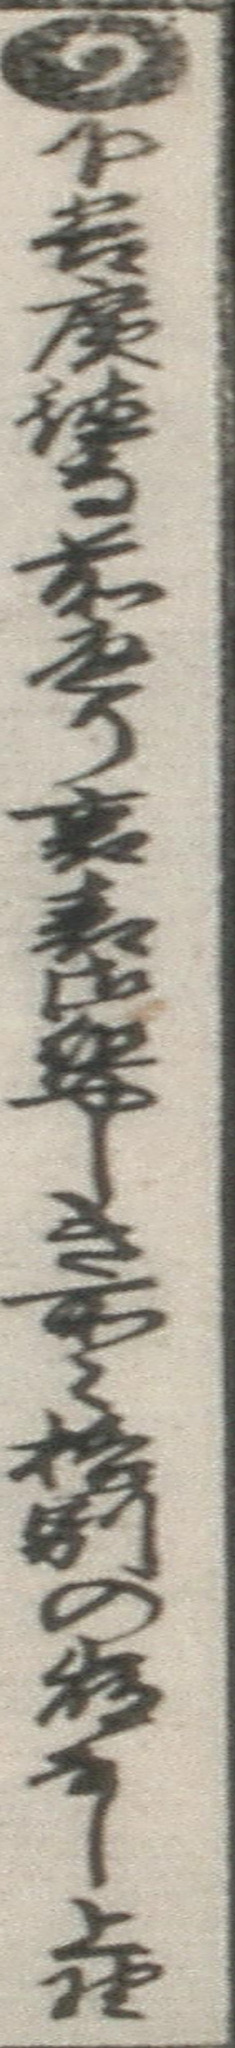り下谷広徳寺前通り裏表御組やしき所々格別の崩なし上野
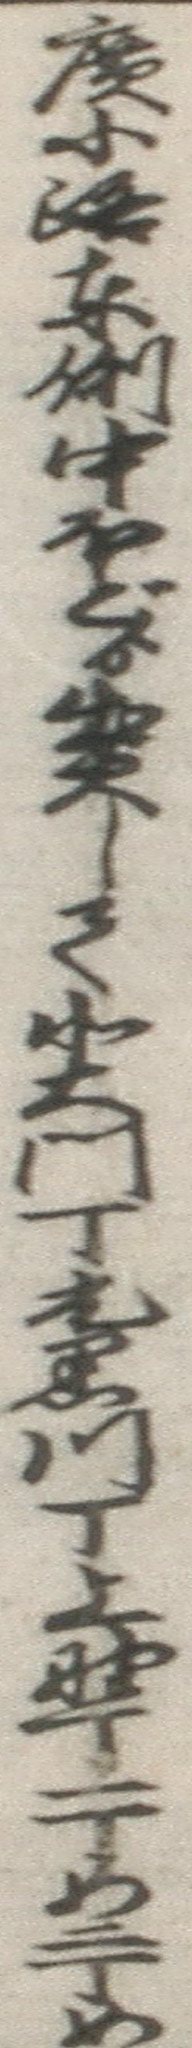広小路東側中ほどゟ出火して北大門丁め黒川丁上野丁一丁め二丁め
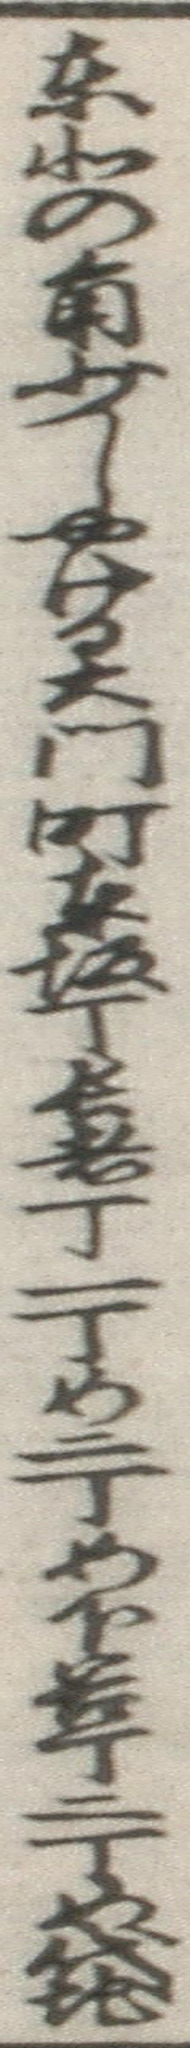東北の角少しやける大門町東坂丁長者丁一丁め二丁め下谷丁二丁代地
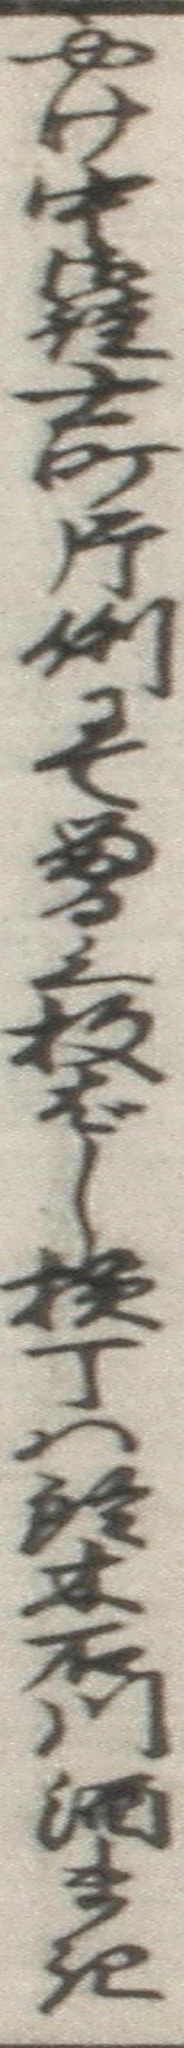やけ中御徒士町片側にて留る三枚ばし横丁ハ鈴木石川酒まき
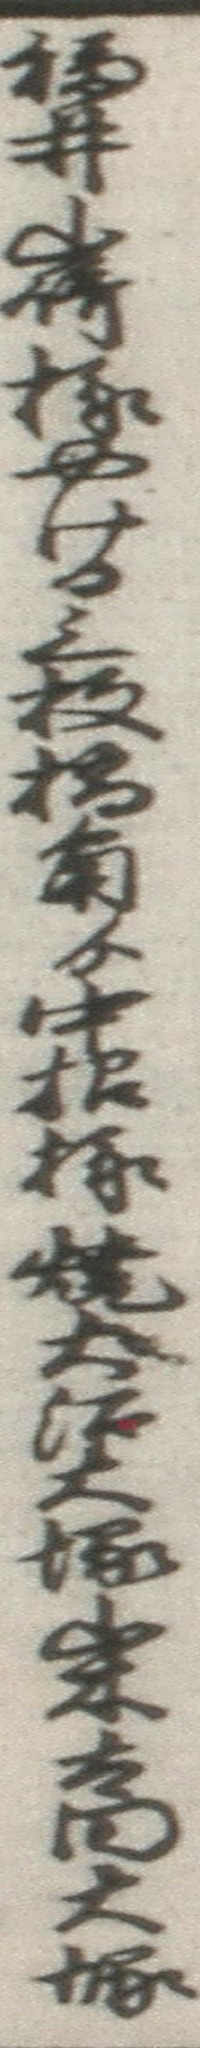福井山崎様やける三枚橋角ゟ中根様焼大沼大塚山本太田大塚
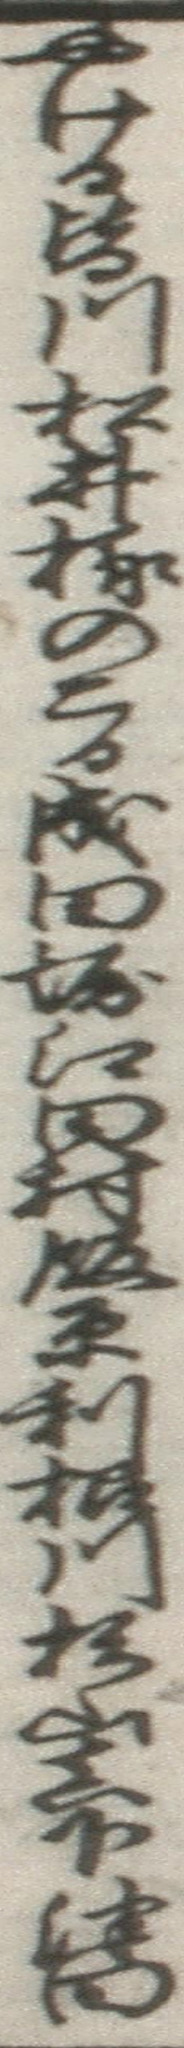やける皆川松井様のこる成田堀江田村飯原利根川杉山真下津田
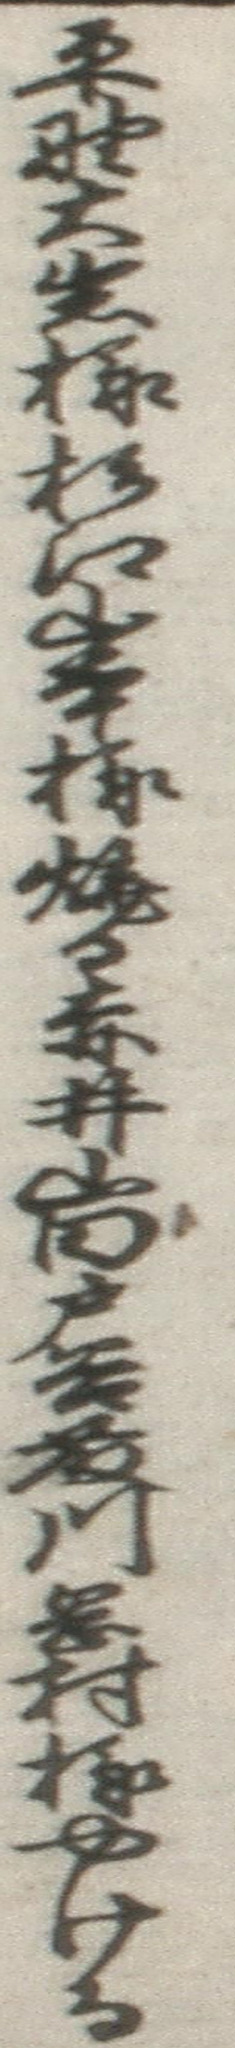平野大岩様杉江山本様焼る赤井山田戸谷藤川岡村様やける
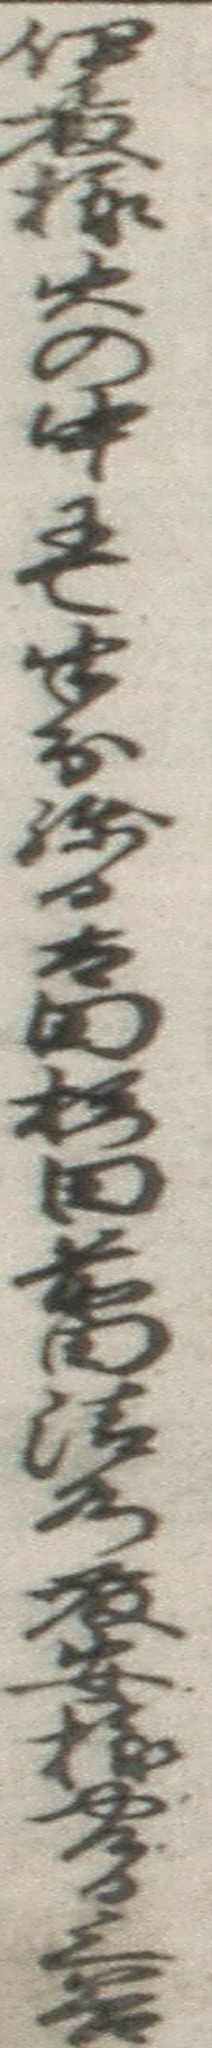伊藤様火の中にて半分残る太田杉田前田清水藤安様やける三谷
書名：大地震焼場細見記
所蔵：東京大学地震研究所図書室 Earthquake Research Institute Library, The University of Tokyo, JAPAN
